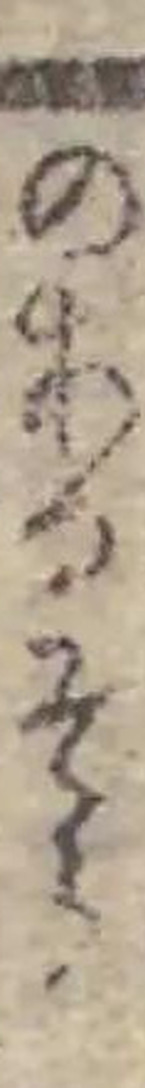のあるそら
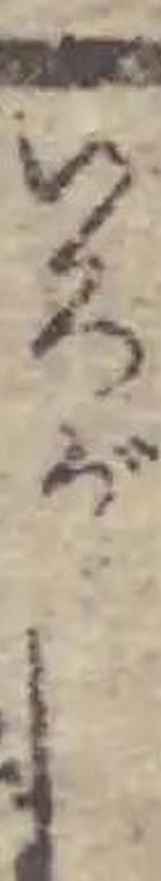いろが
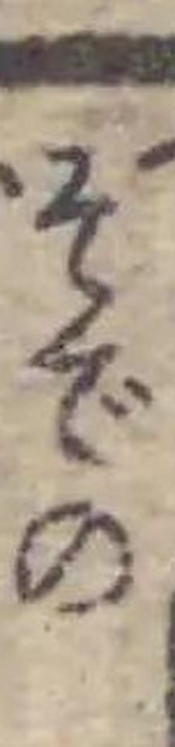そでの
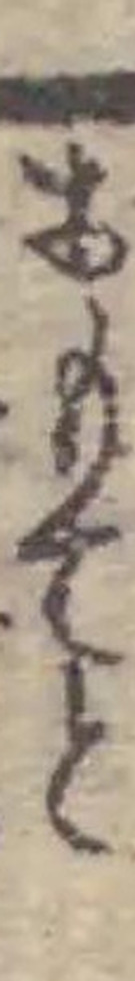おもてと
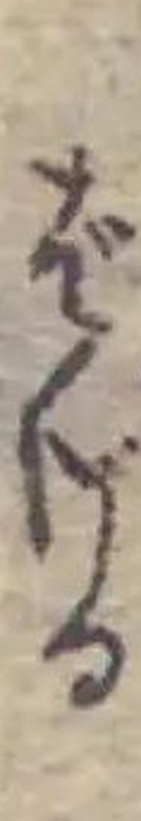ばける

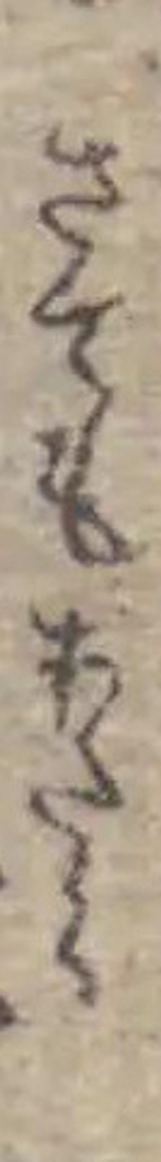さてもあたら
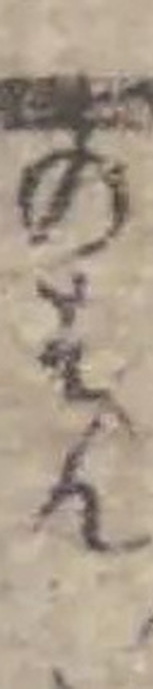のはん
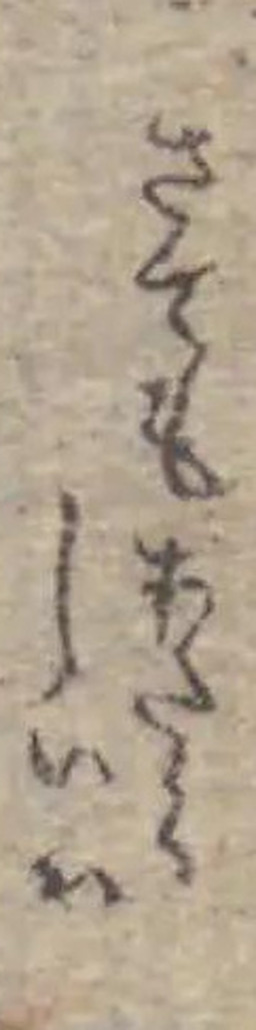しいは
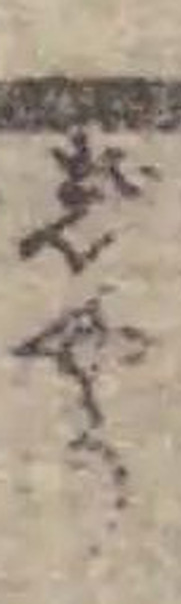じやう
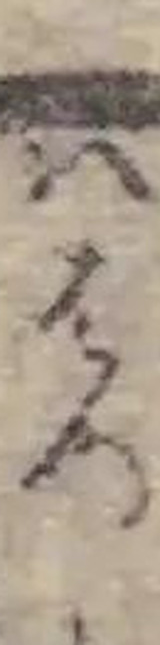ははつ
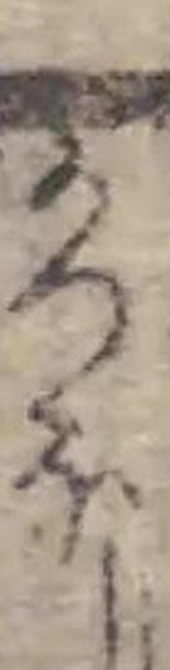かつほ
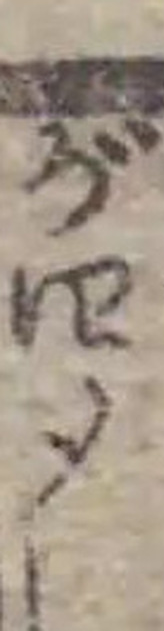が四貫
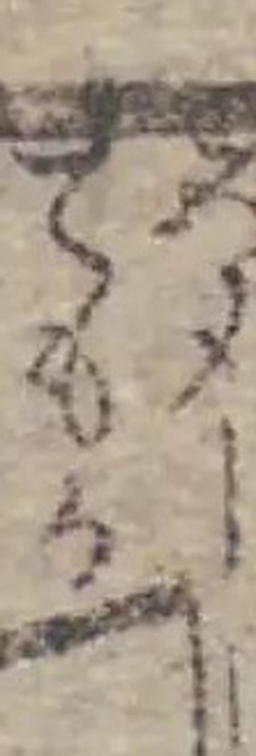てもか
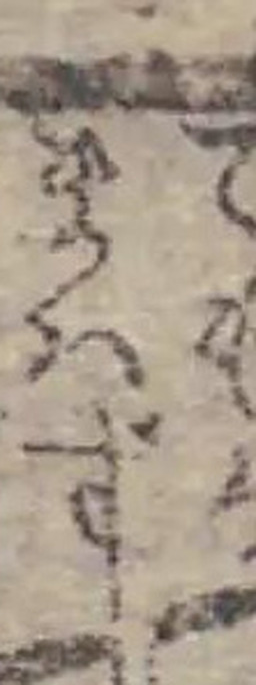まはず
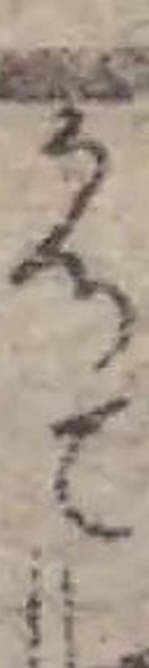かつて
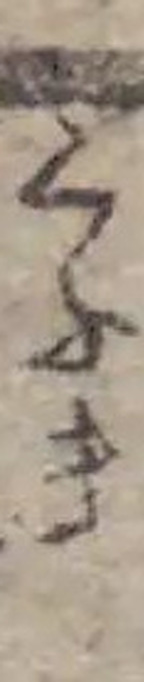くふま
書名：作意妖恐懼感心 2巻
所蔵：国立国会図書館 National Diet Library, JAPAN
